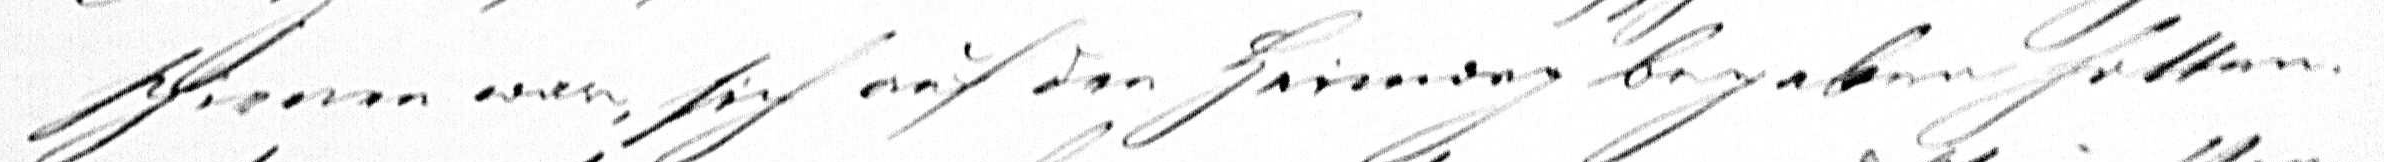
schienen war, sich auf den Heimweg begaben hatten.
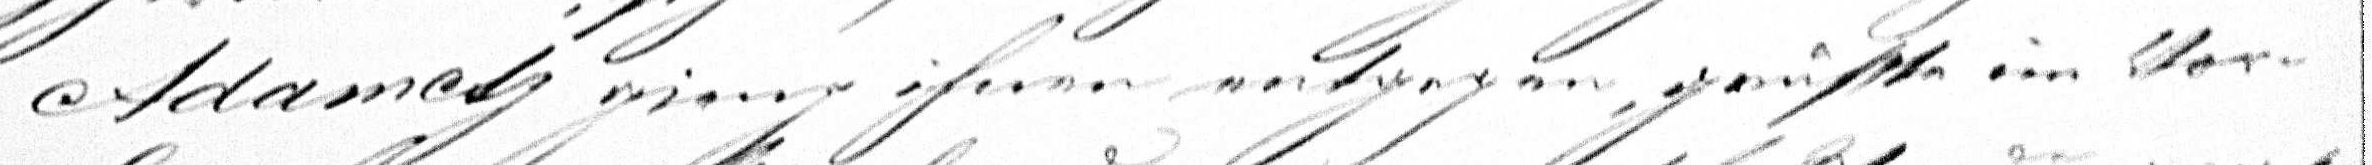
Adametz gieng ihnen entgegen, grüßte im Vor¬
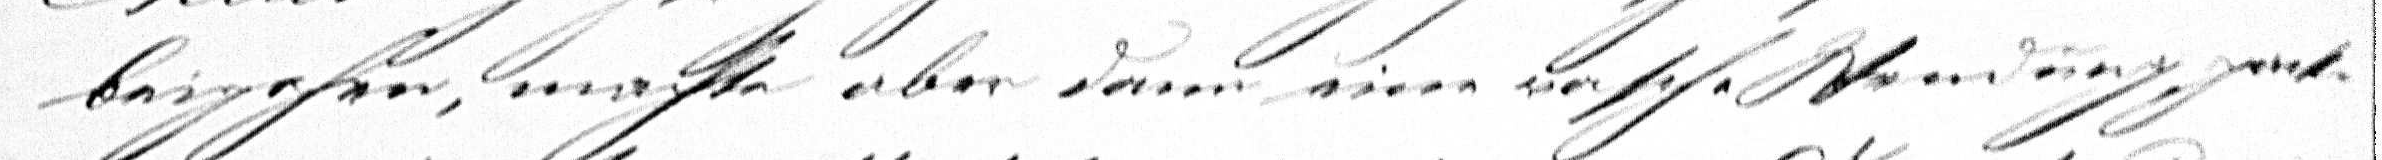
beigehen, machte aber dann eine rasche Wendung, pek¬
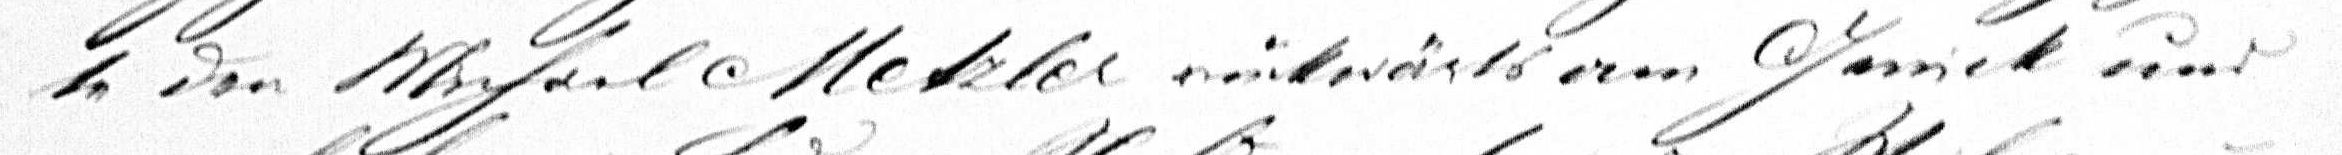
te den Michael Metzler rückwärts am Genick und
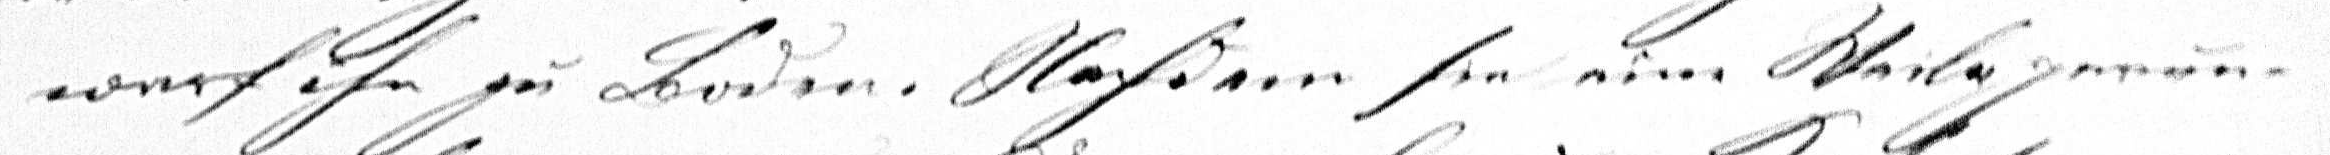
warf ihn zu Boden. Nachdem sie eine Weile gerun¬
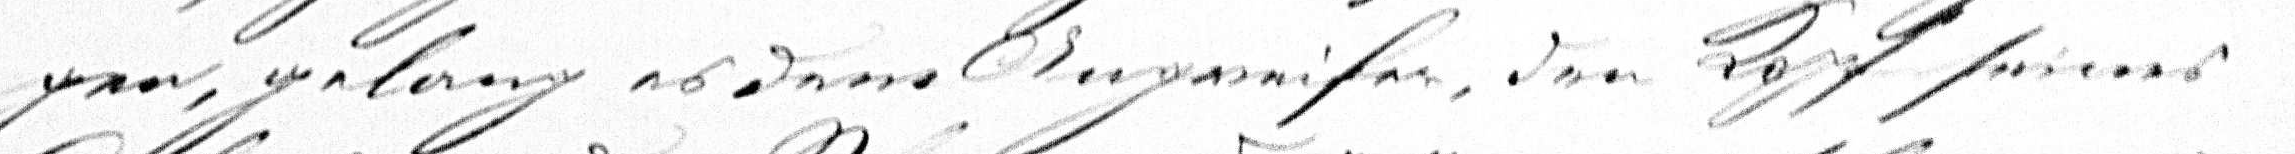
gen, gelang es dem Angreifer, den Kopf seines
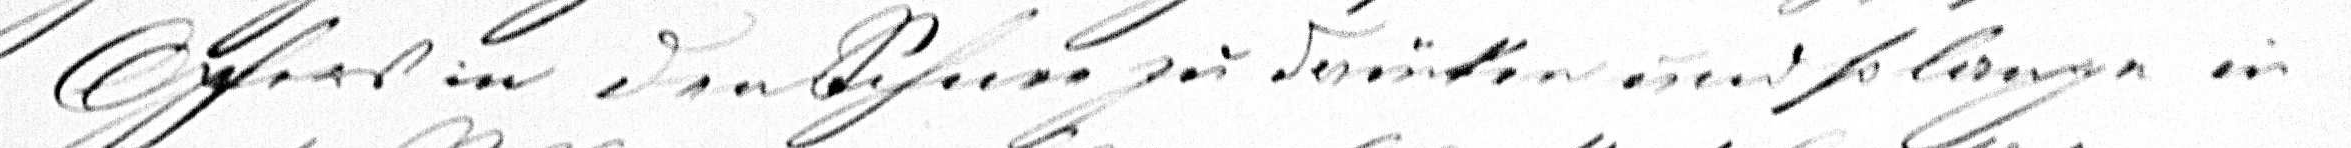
Opfers in den Schnee zu drücken und so lange in
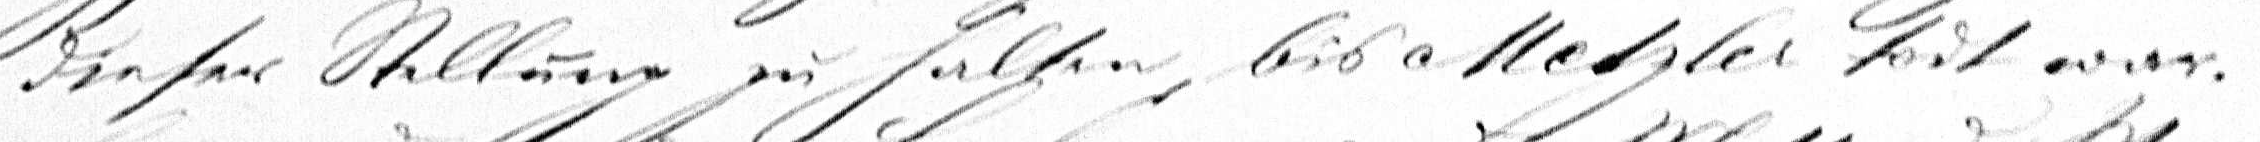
dieser Stellung zu halten, bis Metzler todt war.
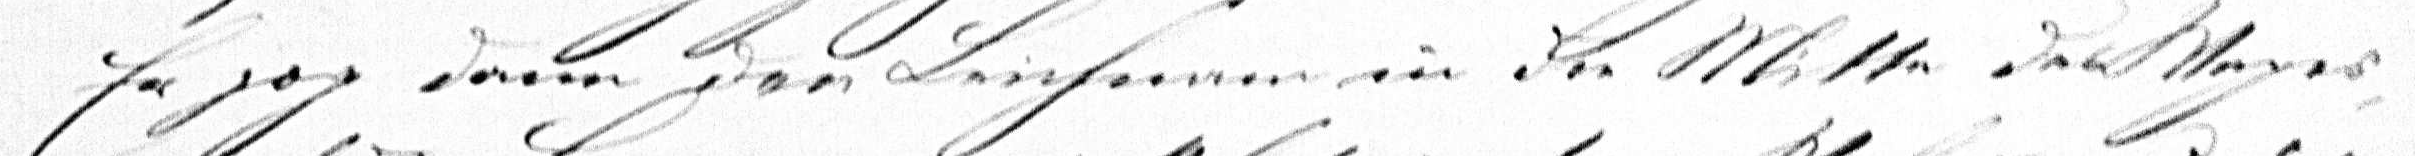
Er zog dann den Leichnam in die Mitte des Weges,
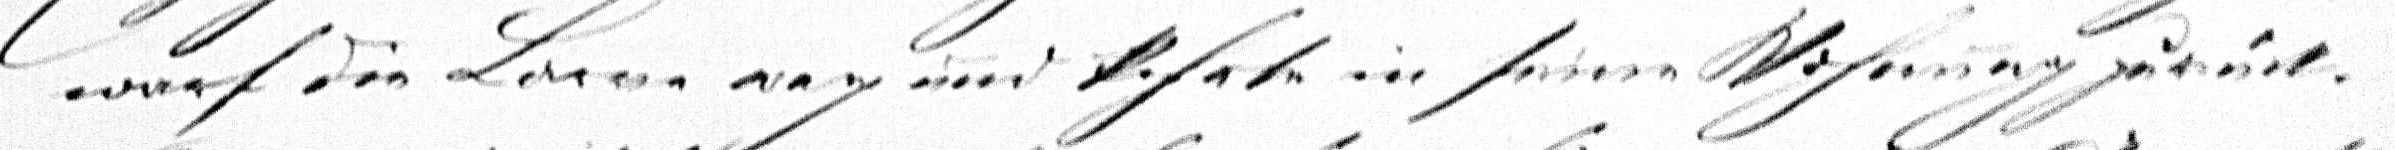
warf die Larve weg und kehrte in seine Wohnung zurück.
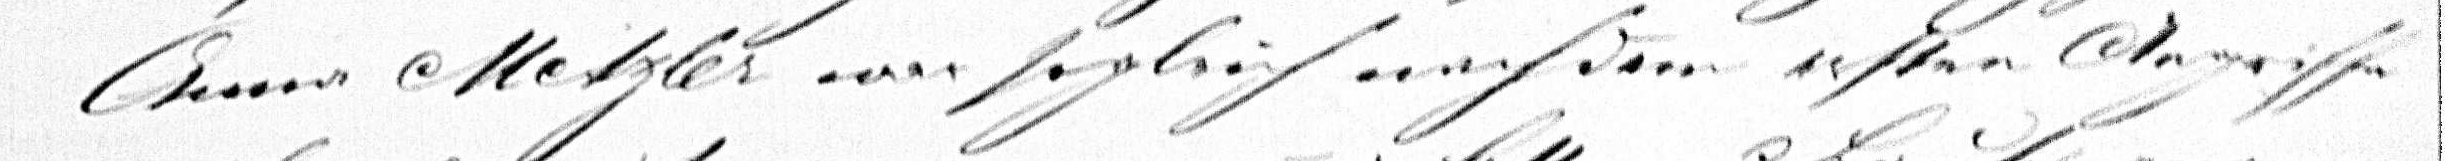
Anna Metzler war sogleich nach de ersten Angriffe
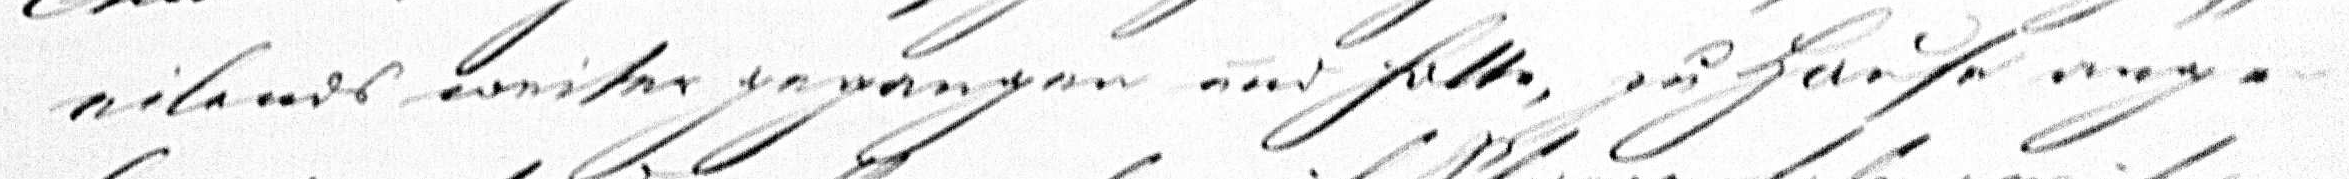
eilends weiter gegangen und hatte, zu Hause ange¬
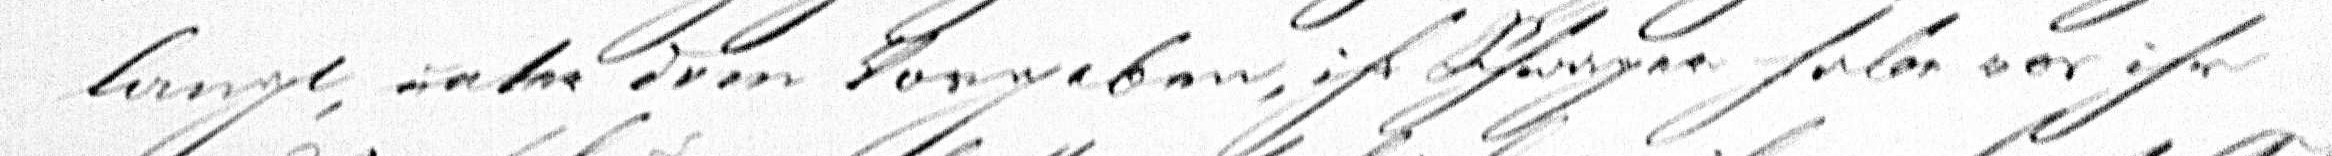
langt, unter dem Vorgeben, ihr Schwager habe vor ihr
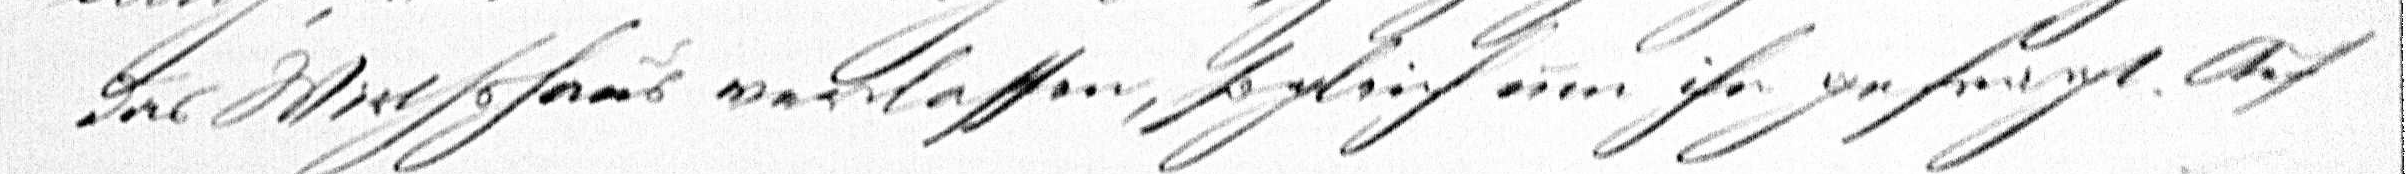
das Wirthshaus verlassen, sogleich um ihn gefragt. Auf
